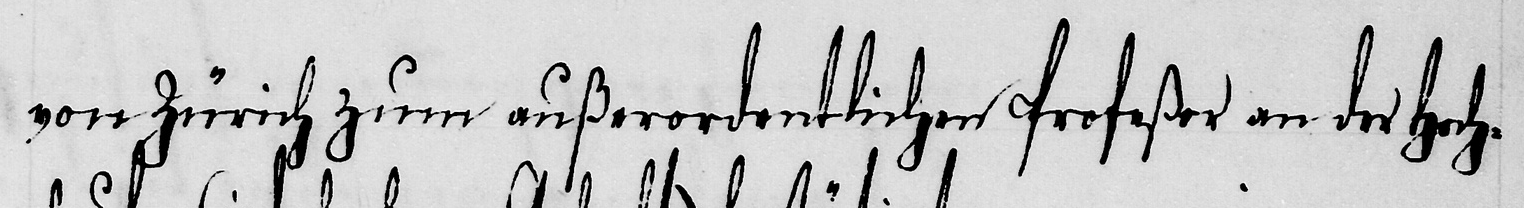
von Zürich zum außerordentlichen Profeßor an der Hoch¬
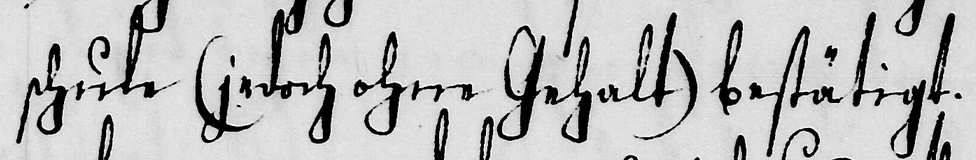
schule (jedoch ohne Gehalt) bestätigt.
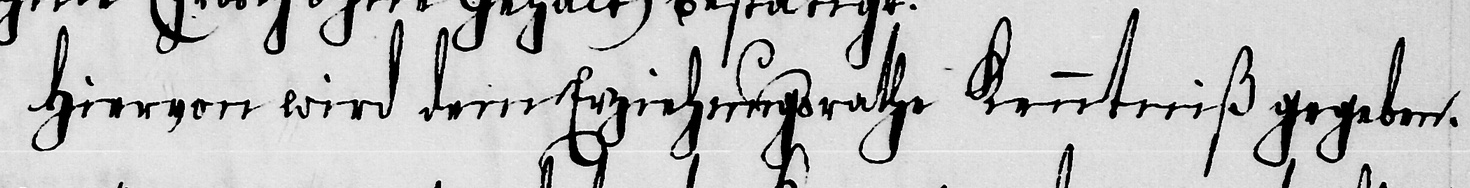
Hiervon wird dem Erziehungsrathe Kenntniß gegeben.
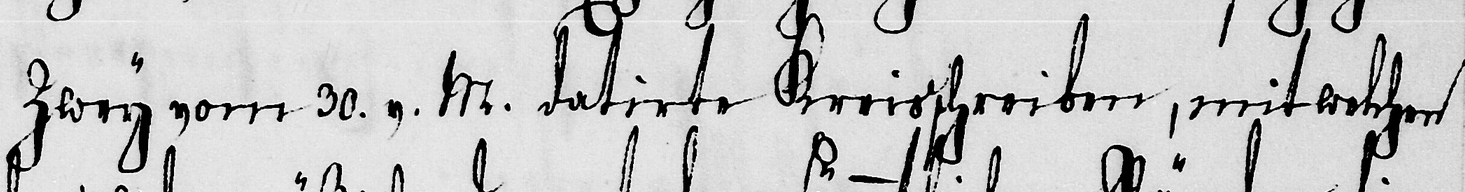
Zwey vom 30. v. M. datirte Kreisschreiben, mit welchen
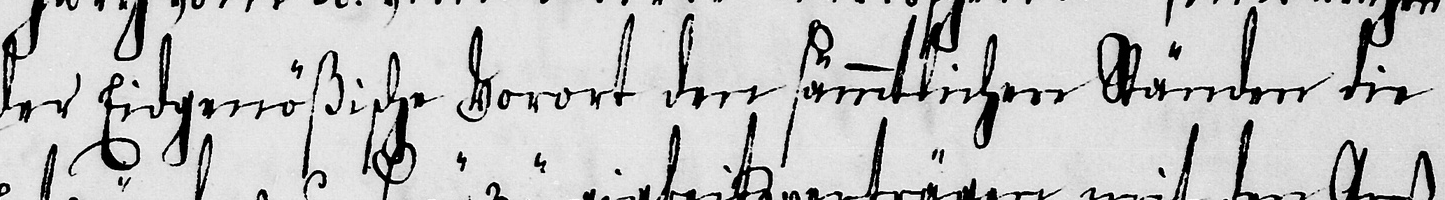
der Eidgenößische Vorort den sämmtlichen Ständen die
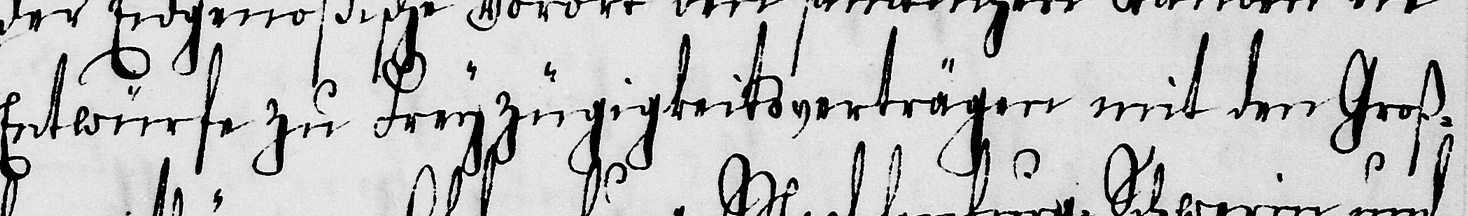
Entwürfe zu Feryzügigkeitsverträgen mit den Groß¬
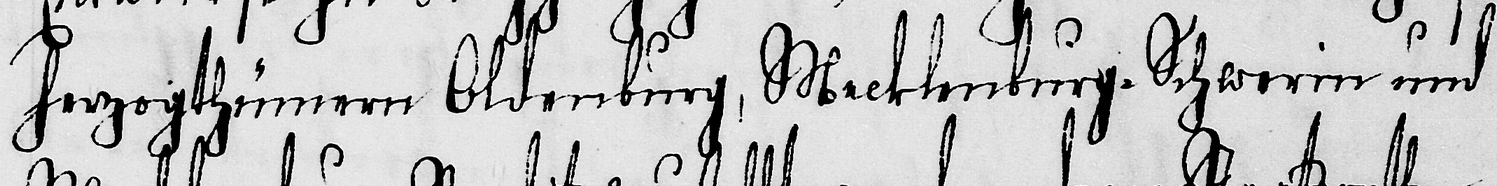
herzogthümern Oldenburg, Mecklenburg-Schwerin und
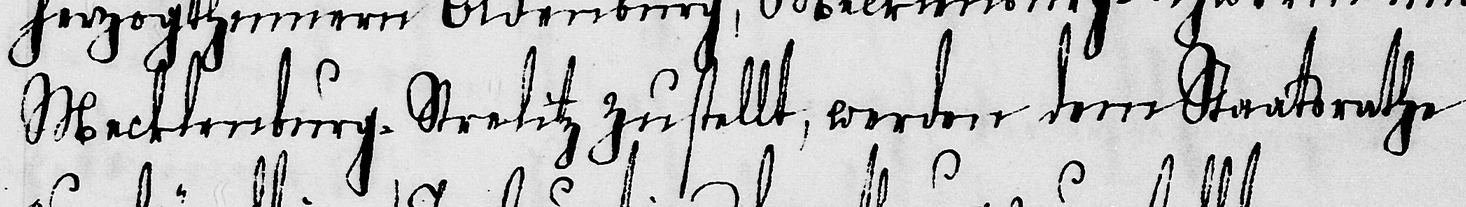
Mecklenburg-Strelitz zustellt, werden dem Staatsrathe
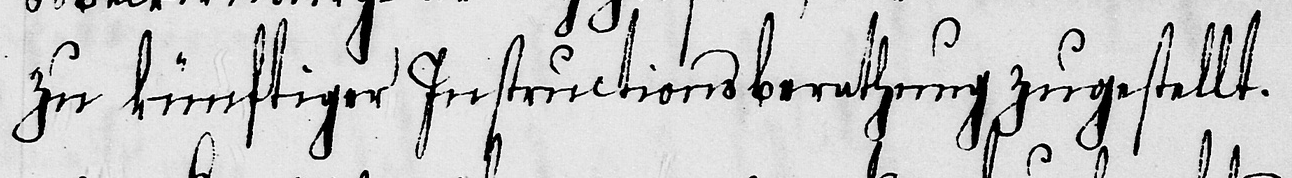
zu küftiger Instructionsberathung zugestellt.
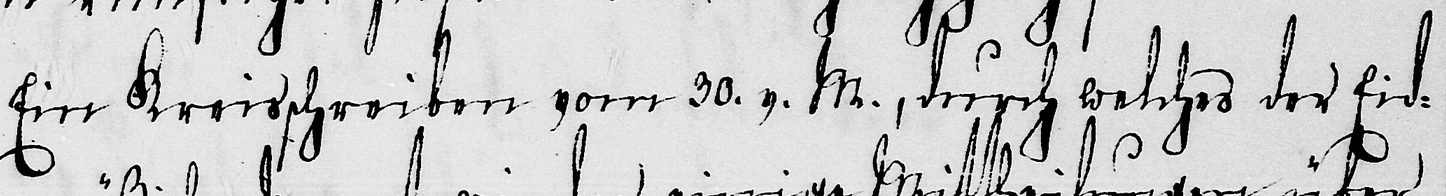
Ein Kreisschreiben vom 30. v. M., durch welches der Eid¬
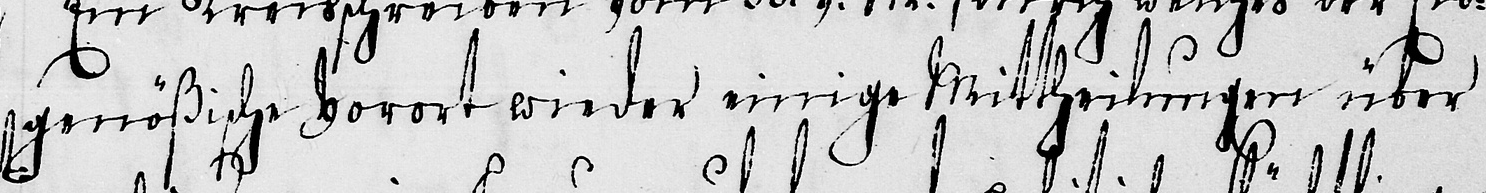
genößische Vorort wieder einige Mittheilungen über
